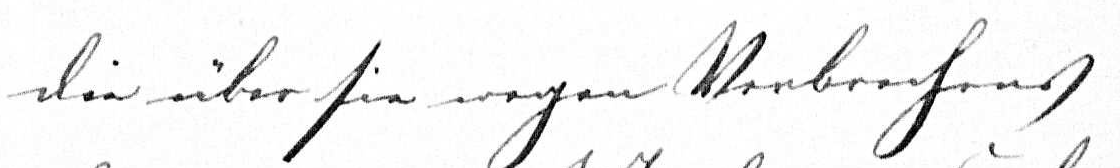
die über sie wegen Verbrechens
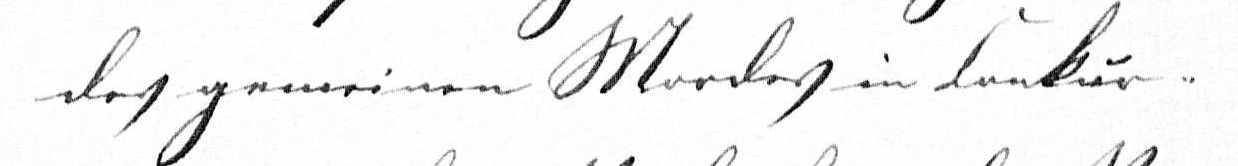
des gemeinen Mordes in Konkur¬
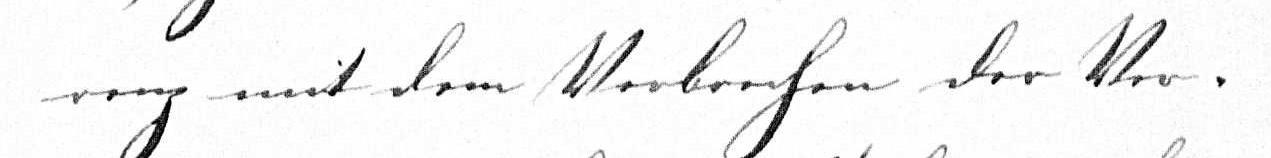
renz mit dem Verbrechen der Ver¬
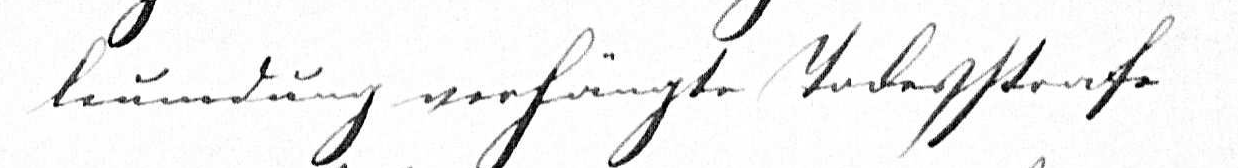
leumdung verhängte Todesstrafe
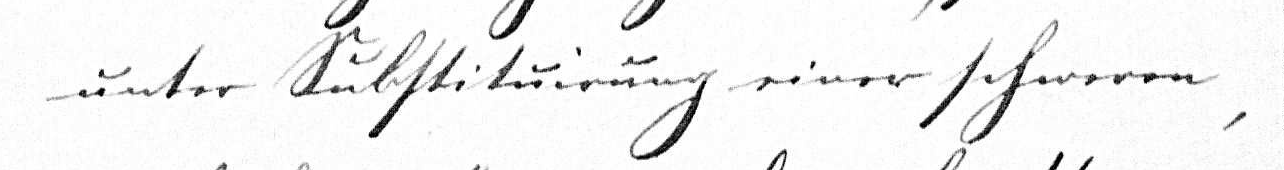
unter Substituerung einer schweren,
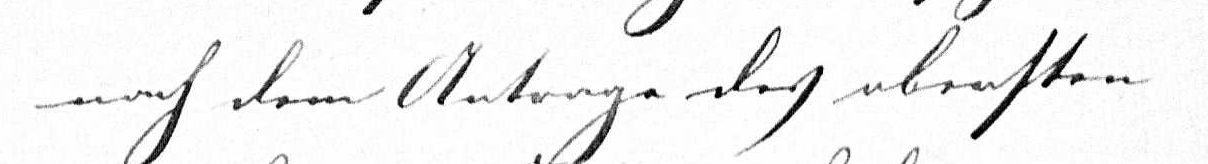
nach dem Antrage des Obersten
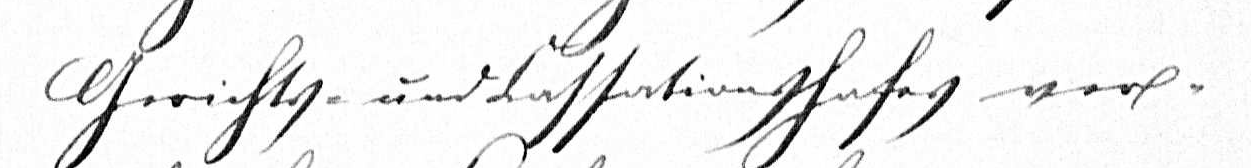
Gerichts- und Cassationshofes ver¬
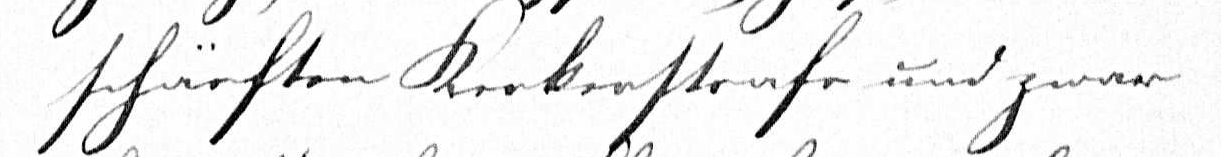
schärften kerkerstrafe, und zwar
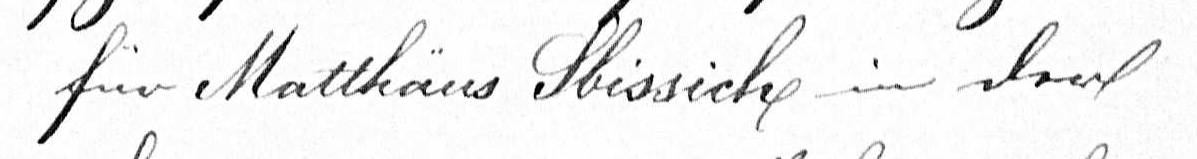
für Matthäus Sbissich in der
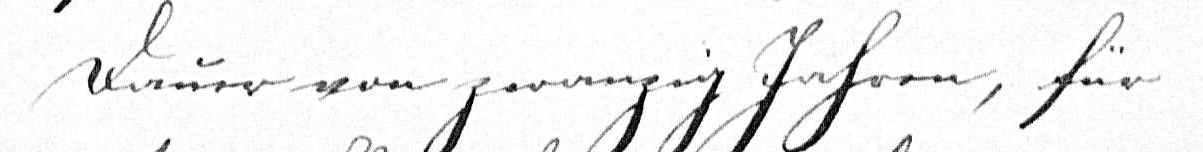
Dauer von zwanzig Jahren, für
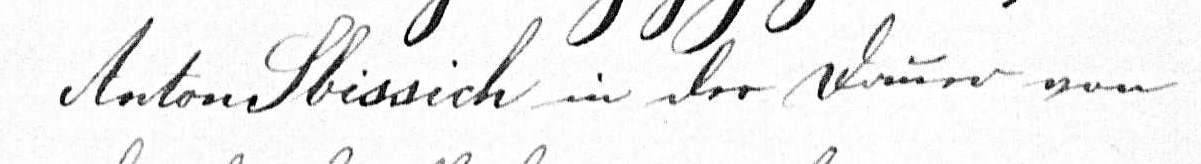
Anton Sbissich in der Dauer von
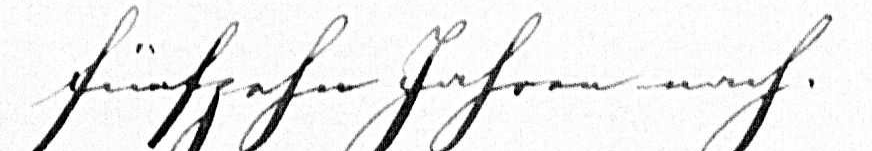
fünfzehn Jahren, nach.
